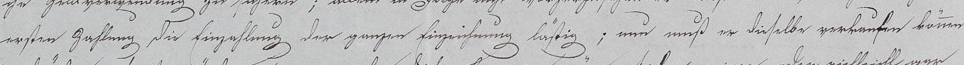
ersten Zahlung die Einzahlung der ganzen Einzeichnung lästig; nun muß er dieselbe verkaufen können
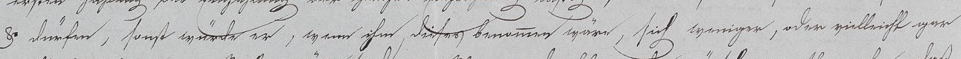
& dürfen, sonst würde er, wenn ihm dieses benommen wäre, sich weniger, oder vielleicht gar
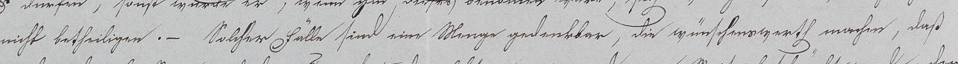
nicht betheiligen. – Solcher Fälle sind eine Menge gedenkbar, die wünschenswerth machen, daß
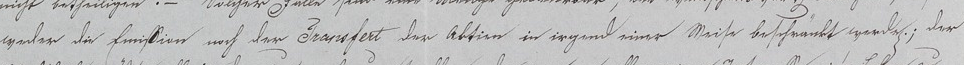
weder die Emission noch der Transfert der Actien in irgend einer Weise beschränkt werde; der
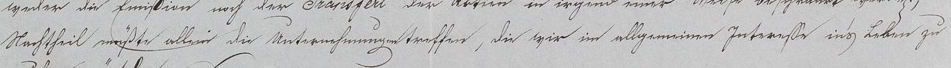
Nachtheil müßte allein die Unternehmungen treffen, die wir im allgemeinen Interesse in's Leben zu
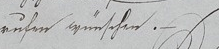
rufen wünschen. –
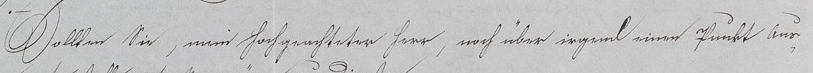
Sollten Sie, mein hochgeachteter Herr, noch über irgend einen Punkt Aus-
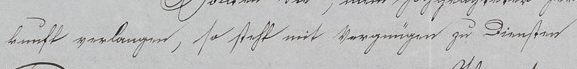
kunft verlangen, so steht mit Vergnügen zu Diensten
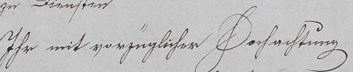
Ihr mit vorzüglicher Hochachtung
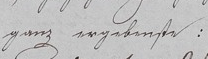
ganz ergebenste:
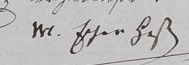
M. Escher Heß
